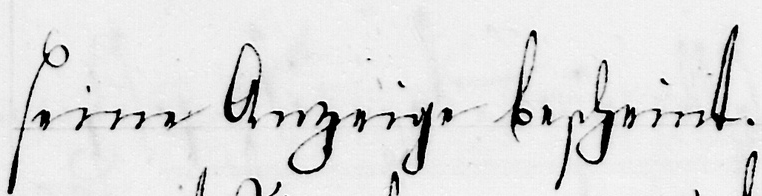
seine Anzeige bescheint.
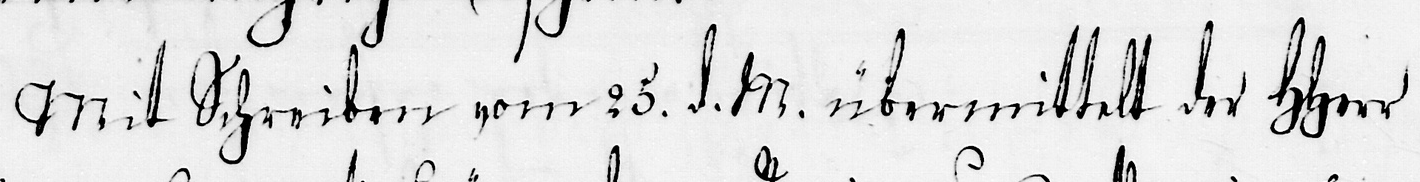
Mit Schreiben vom 25. d. M. übermittelt der HHerr
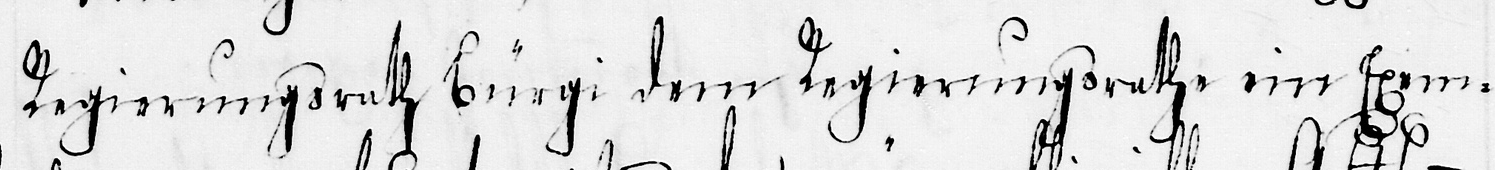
Regierungsrath Bürgi dem Regierungsrathe ein Exem¬
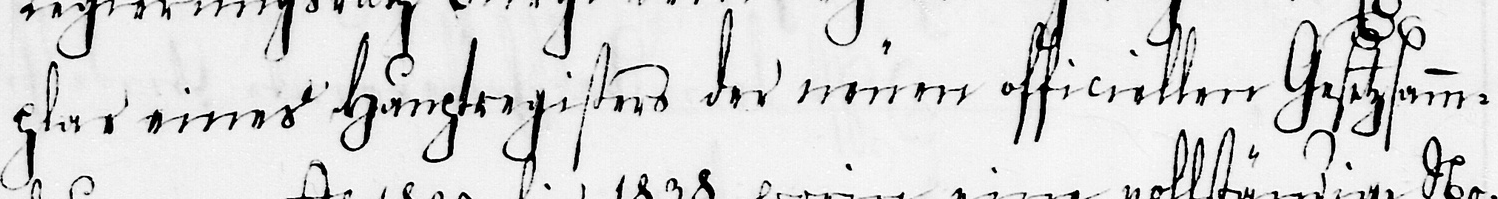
plar eines Hauptregisters der neuen officiellen Gesetzsamm¬
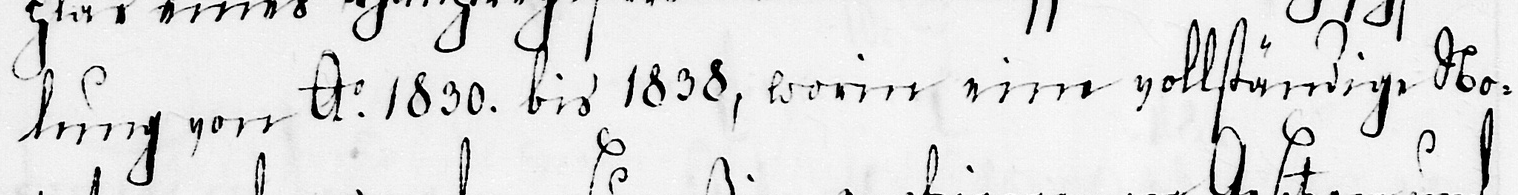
lung von Ao. 1830. bis 1838, worin eine vollständige No¬
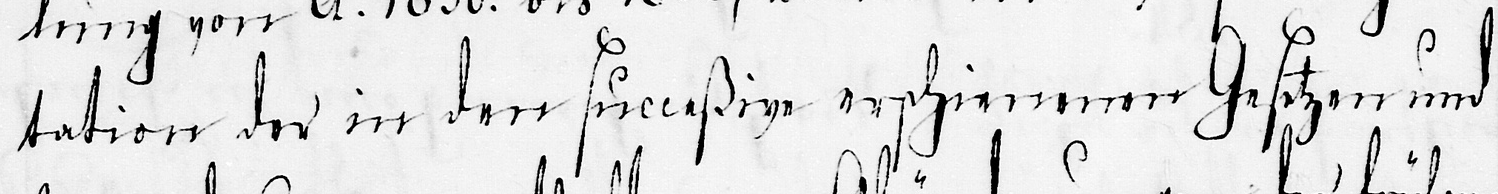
tation der in den succeßive erschienenen Gesetzen und
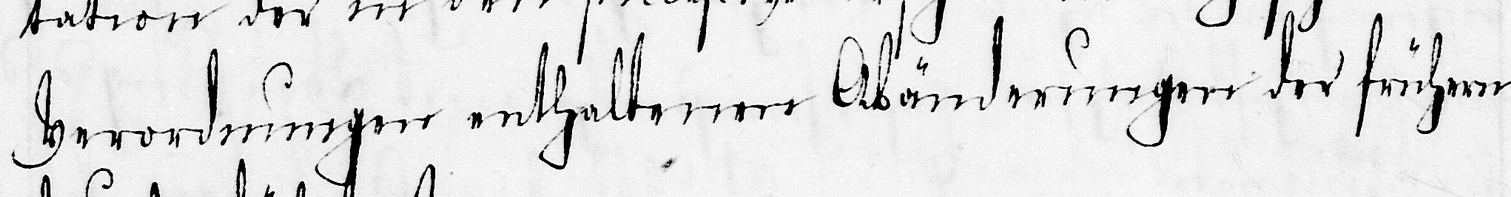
Verordnungen enthaltenen Abänderungen der frühern
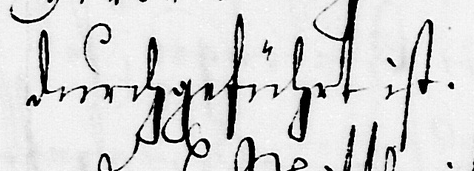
durchgeführt ist.
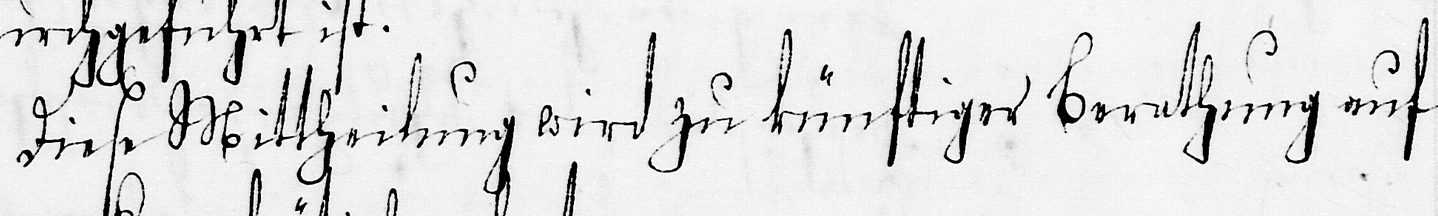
Diese Mittheilung wird zu künftiger Berathung auf
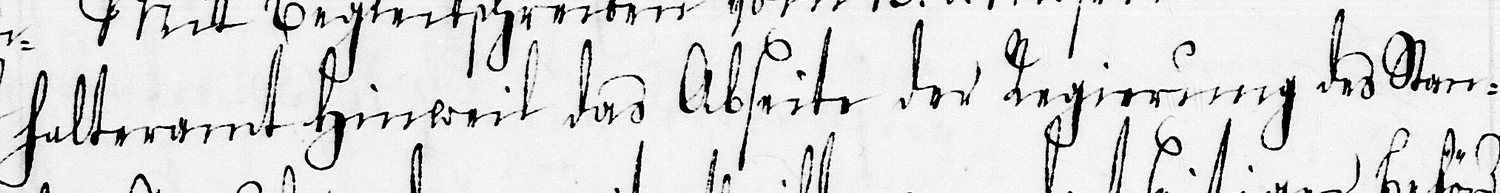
thalteramt Hinweil das Abseite der Regierung des Stan¬
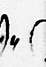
den
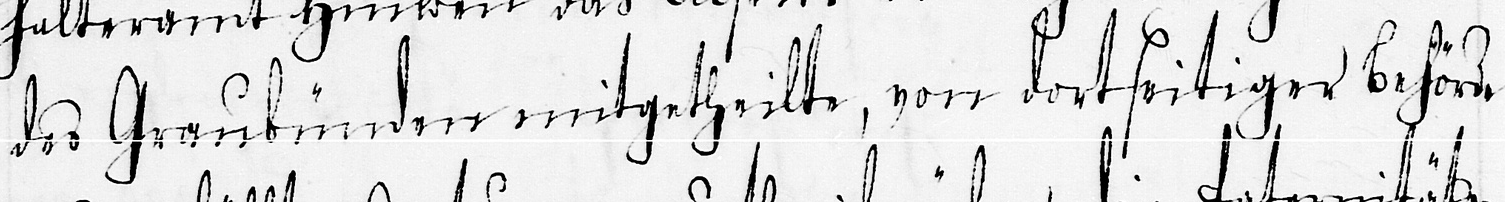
des Graubünden mitgetheilte, von dortseitiger Behörde
